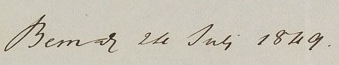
Bern den 24 Juli 1849.
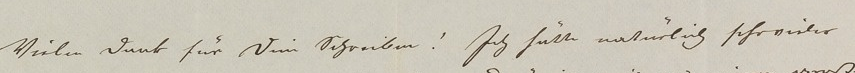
Vielen Dank für Dein Schreiben! Ich hätte natürlich sehr vieles
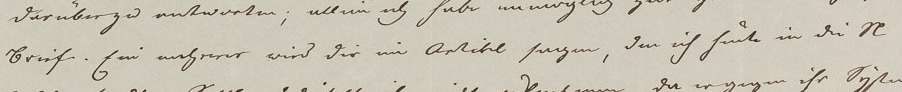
Briefe. Ein mehreres wird dir ein Artikel sagen, den ich heute in die N
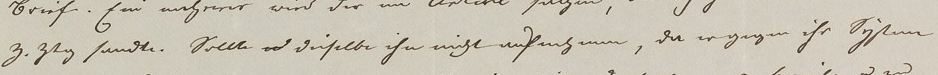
Z. Ztg sandte. Sollte n dieselbe ihn nicht aufnehmen, da er gegen ihr System
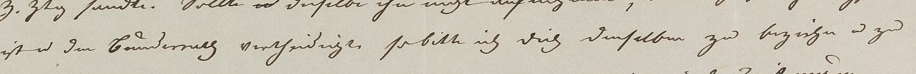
ist u den Bundesrath vertheidigt, so bitte ich Dich denselben zu beziehen u zu
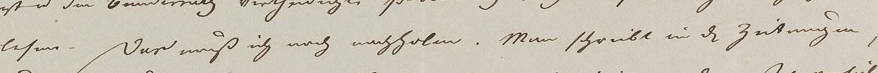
lesen. Das muß ich noch nachholen. Man schreibt in den Zeitungen,
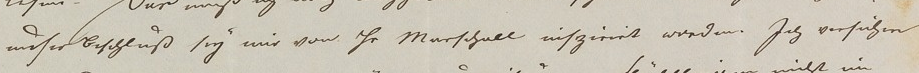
unser Beschluß sey mir von Hr Marschall inspirirt worden. Ich versichere
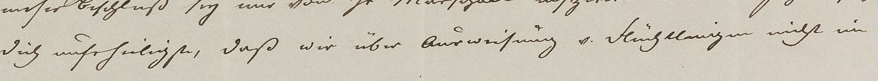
Dich aufs heiligste, daß wir über Ausweisung v. Flüchtlingen nicht ein
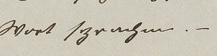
Wort sprachen. –
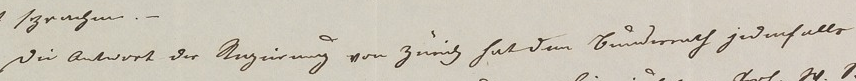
Die Antwort der Regierung von Zürich hat dem Bundesrath jedenfalls
